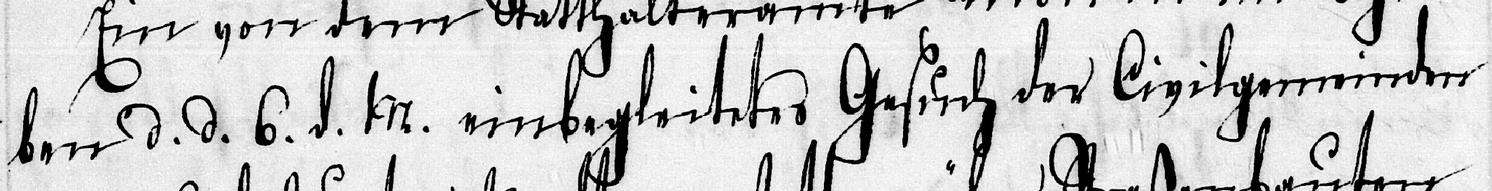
ben d. d. 6. d. M. einbegleitetes Gesuch der Civilgemeinden
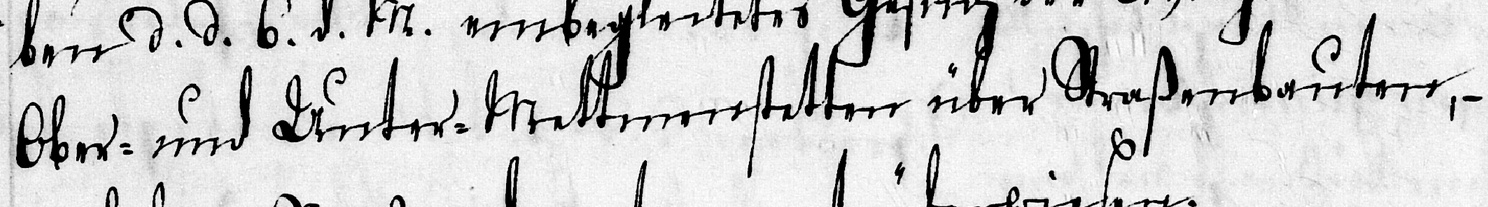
Ober- und Unter-Mettmenstetten über Straßenbauten, –
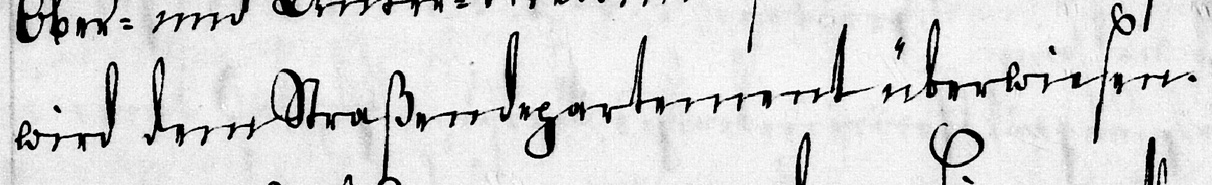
wird dem Straßendepartement überwiesen.
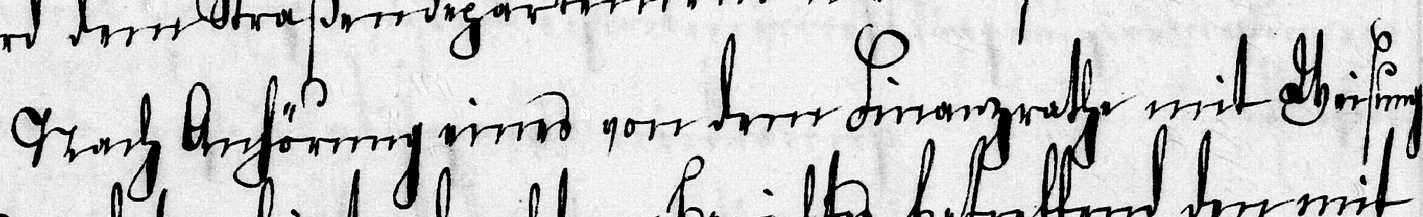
Nach Anhörung eines von dem Finanzrathe mit Weisu¬
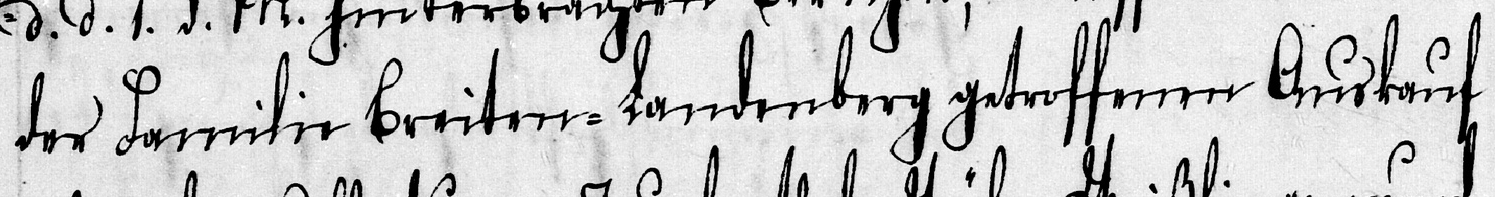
der Familie Breiten-Landenberg getroffenen Auskauf
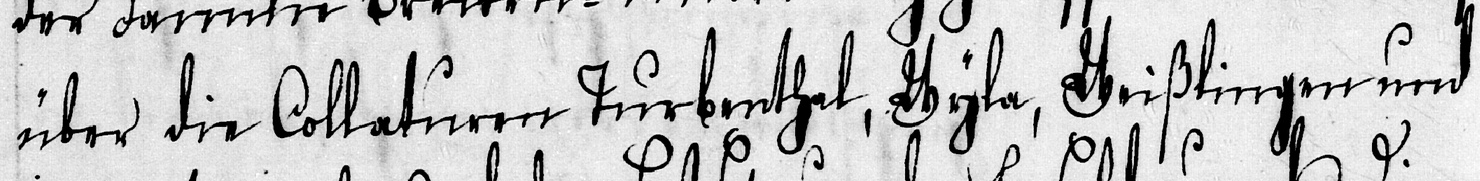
über die Collaturen Turbenthal, Wyla, Weißlingen und
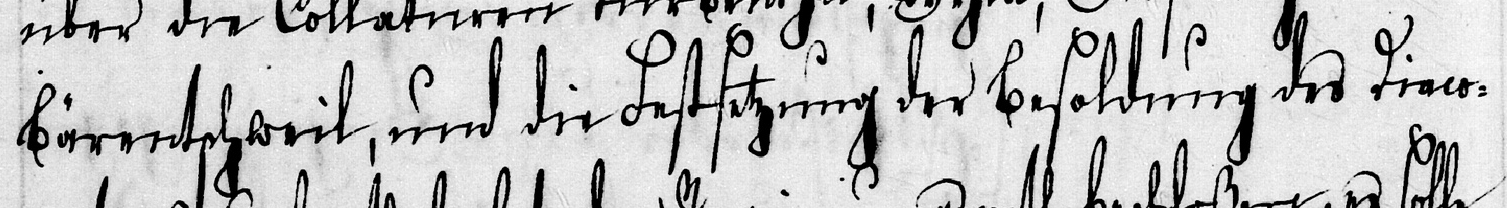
Bärentschweil, und die Festsetzung der Besoldung des Diac¬
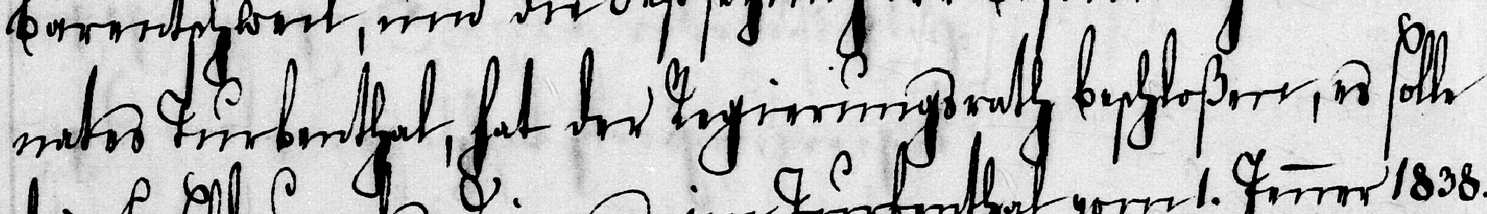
onates Turbenthal, hat der Regierungsrath beschloßen, es sol¬
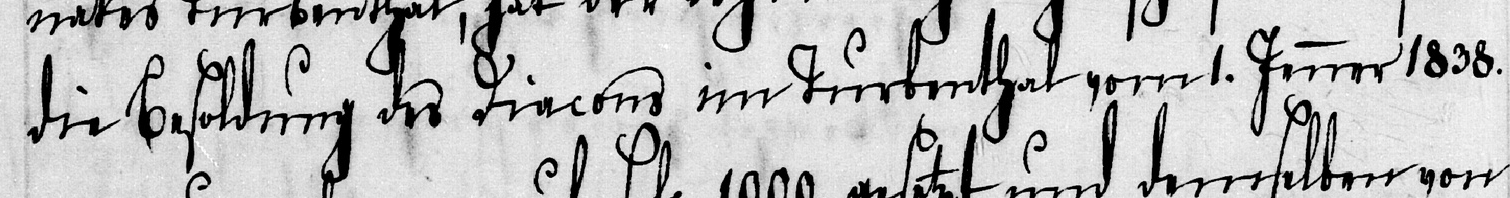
die Besoldung des Diacons im Turbenthal vom 1. Jenner 1838.
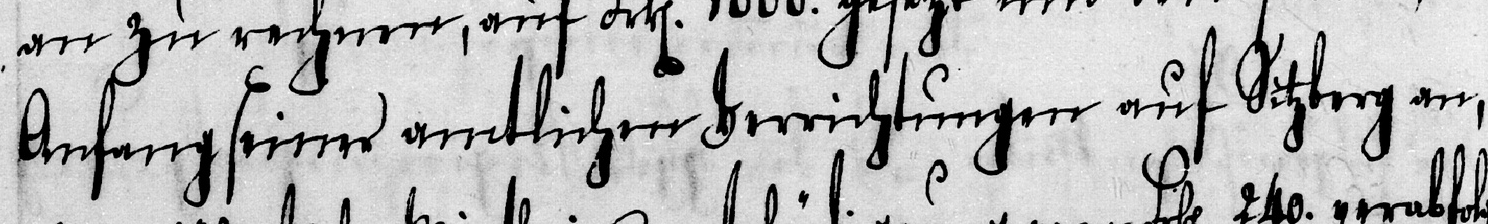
Anfang seiner amtlichen Verrichtungen auf Sitzberg an,
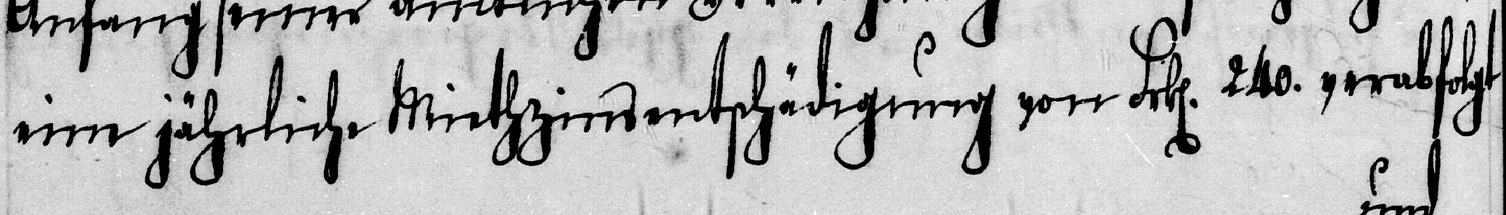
eine jährliche Miethzinsentschädigung von Frk[en]. 240. verab¬
